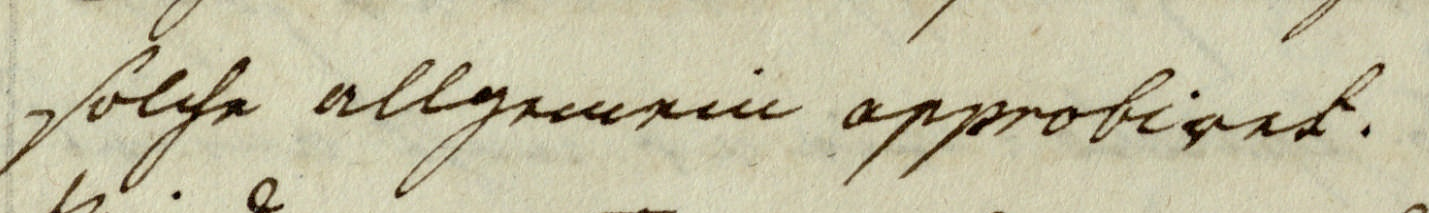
solche allgemein approbiret.
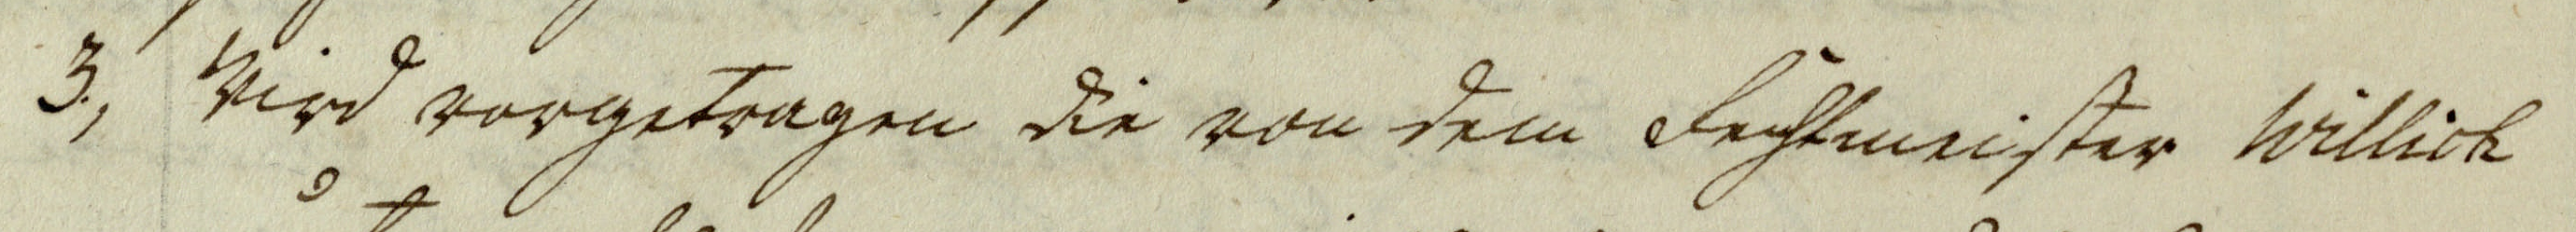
3., Wird vorgetragen die von dem Fechtmeister Willich
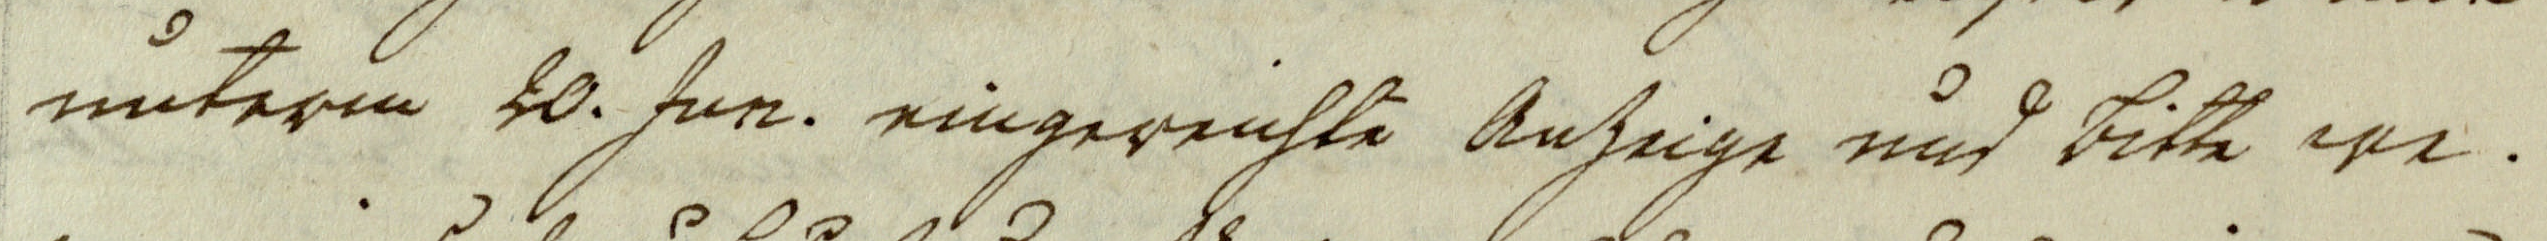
unterm 20. Jun. eingereichte Anzeige und Bitte we¬
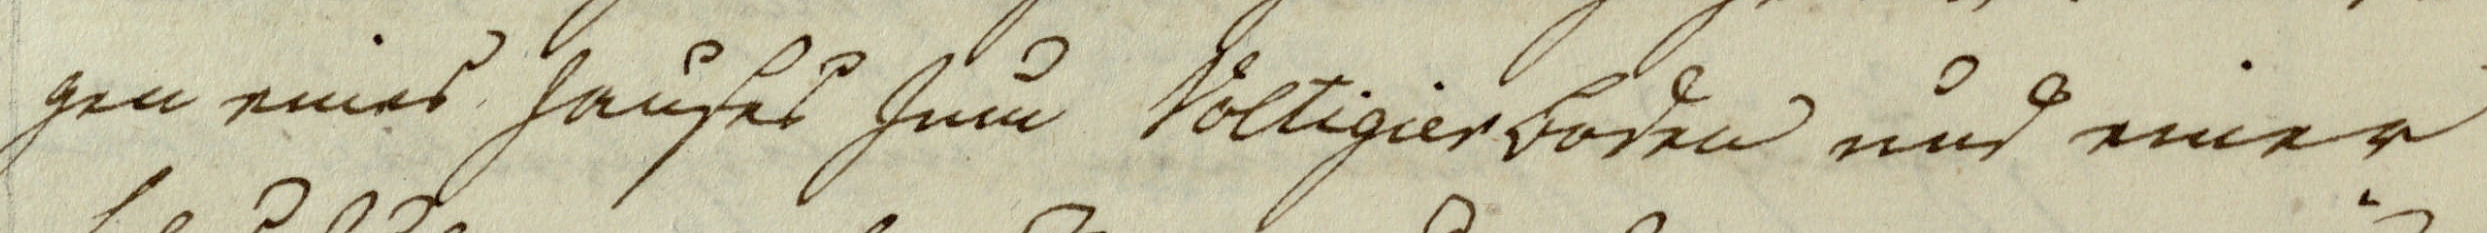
gen eines Hauses zum Voltigier Boden und einer
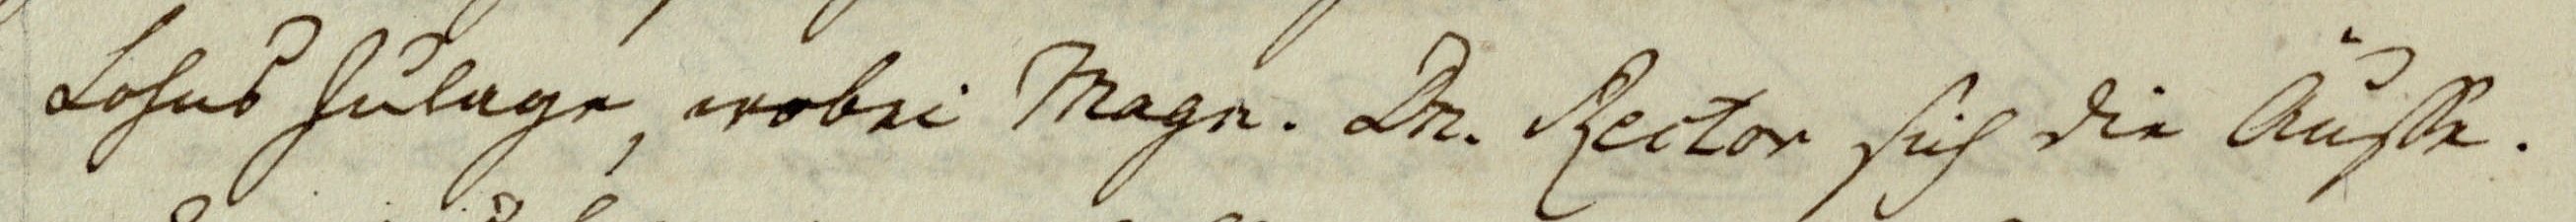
Lohns Zulage, wobei Magn. Dn. Rector sich die Äusse¬
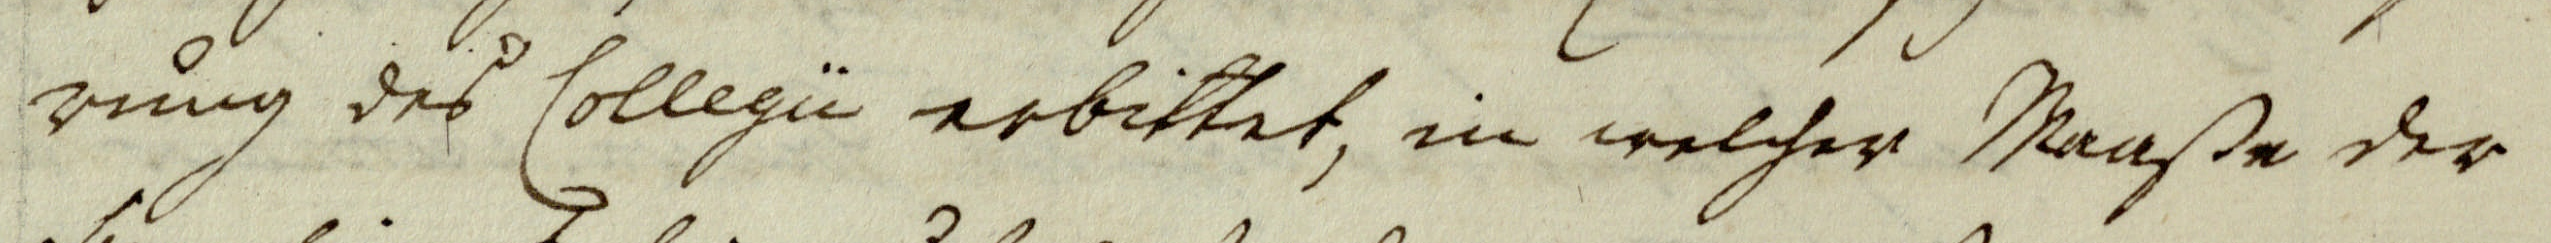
rung des Collegii erbittet, in welcher Maaße der
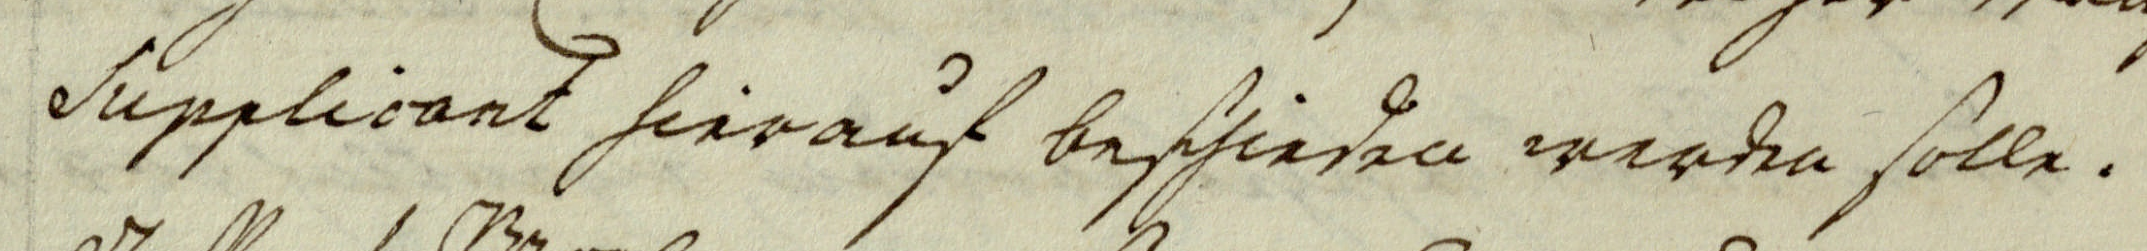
Supplicant hierauf beschieden werden solle.
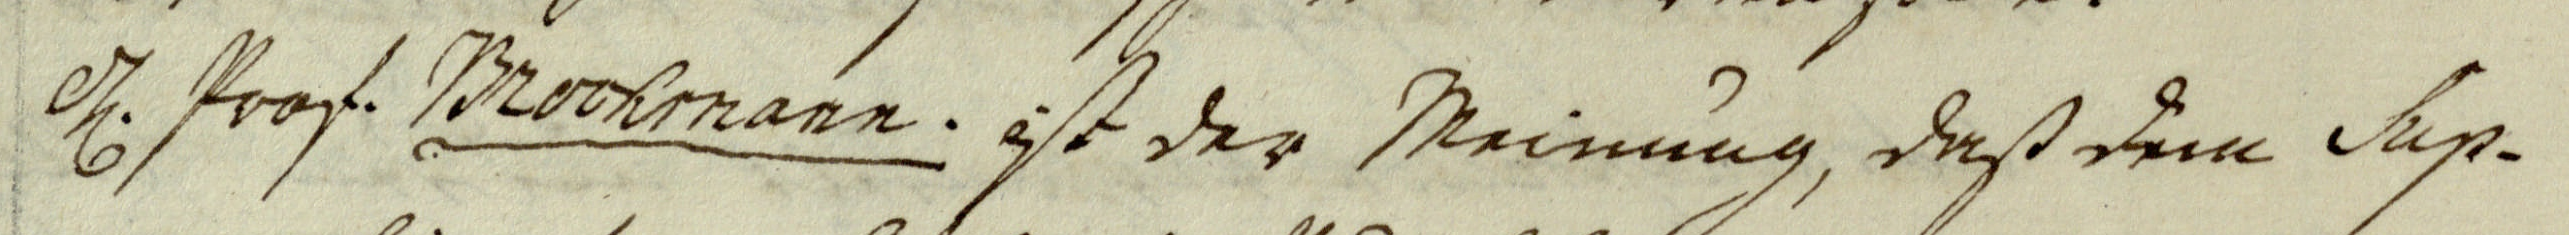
dh. Prof. Brockmann. ist der Meinung, daß dem Sup¬
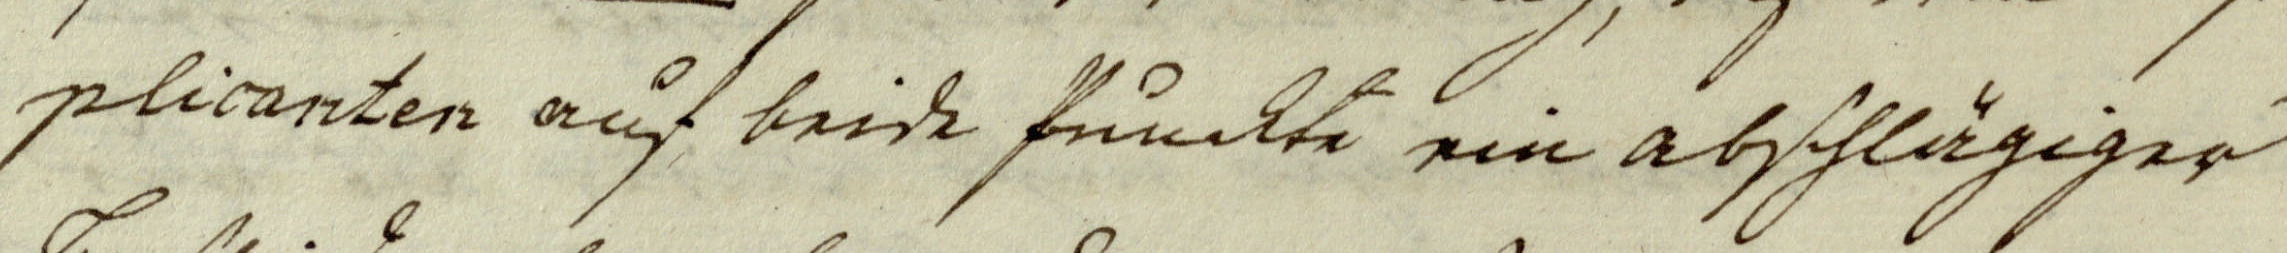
plicanten auf beide Punkte ein abschlägiger
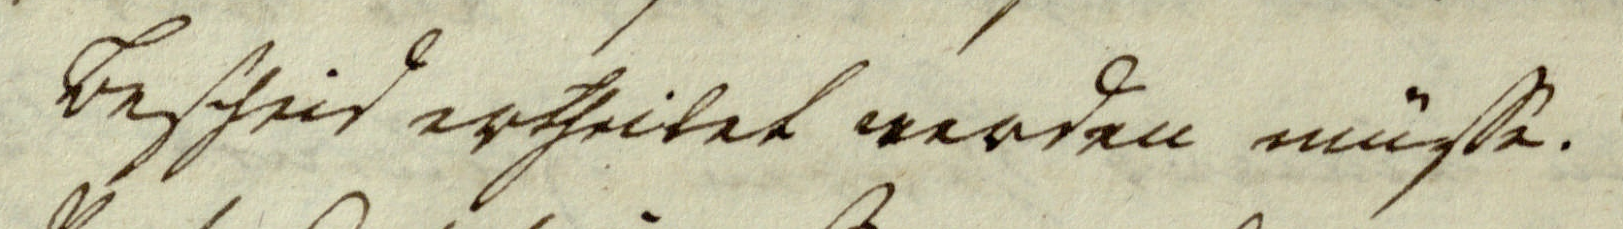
Bescheid ertheilt werden müsse.
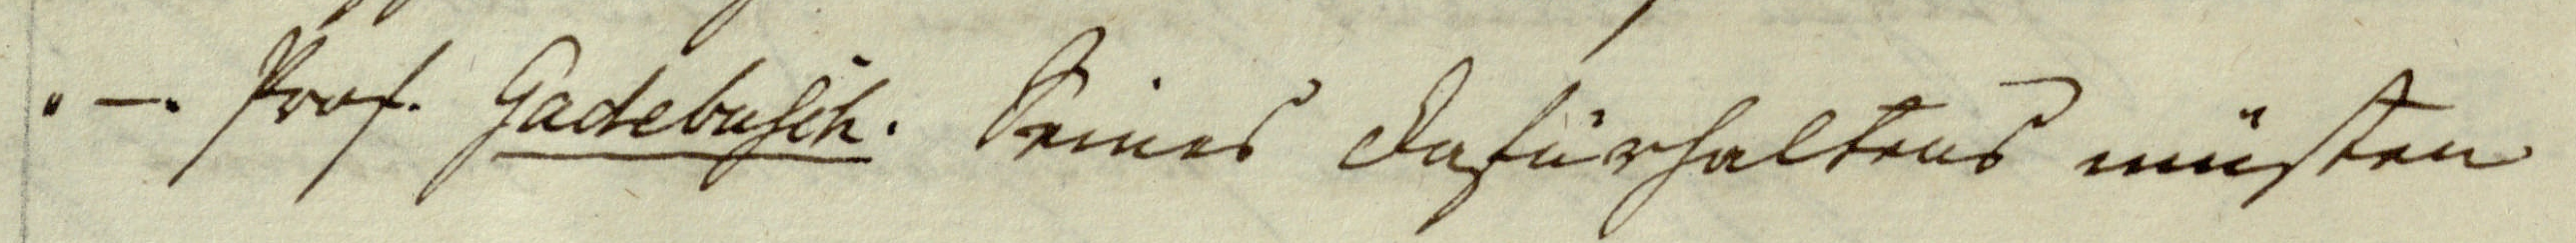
" — . Prof. Gadebusch. Seines Dafürhaltens müssen
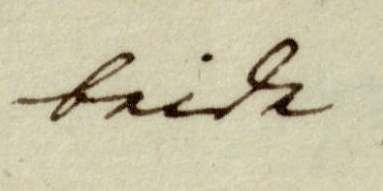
beide
